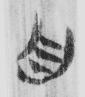自
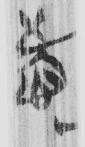㤅
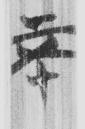不
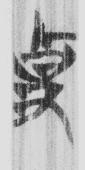史
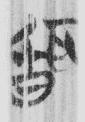䎽
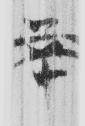不
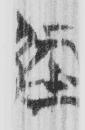{尸几土}
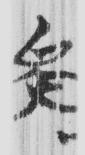矣
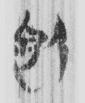飤
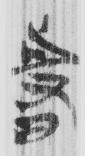時
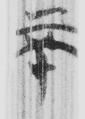不
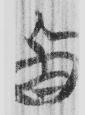旨
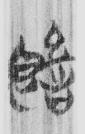{食糸言}
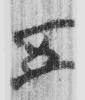五
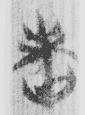味
